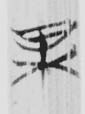果
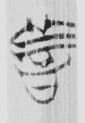善
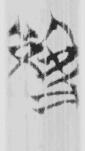{死欠}
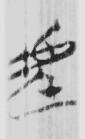𫊟
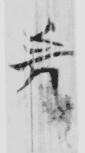先
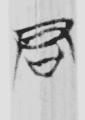君
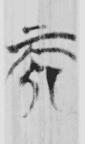而
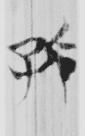孤
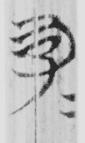乳=
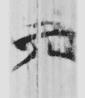亓
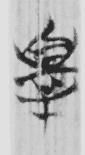辠
